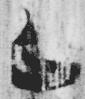㠯（以）
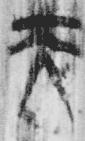天
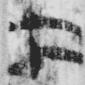下
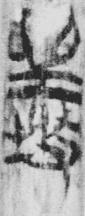襄（讓）
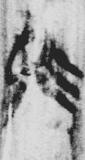於
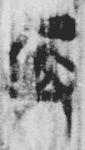臤（賢）
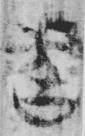者
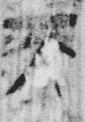天
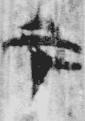下
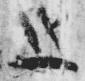之
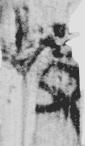臤（賢）
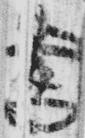者
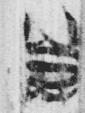莫
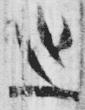之
